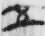五
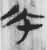帀（師）
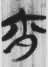宵
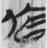倌
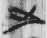之
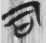司
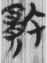敗
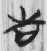告
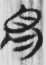胃（謂）
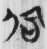卲
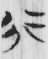行
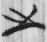之
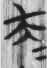大夫
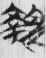執
